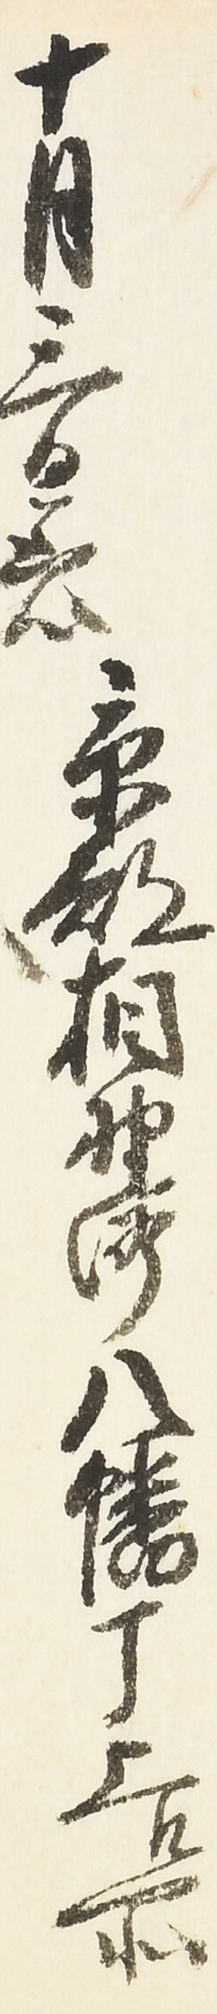十月三日着京都相野町八幡丁上ル所
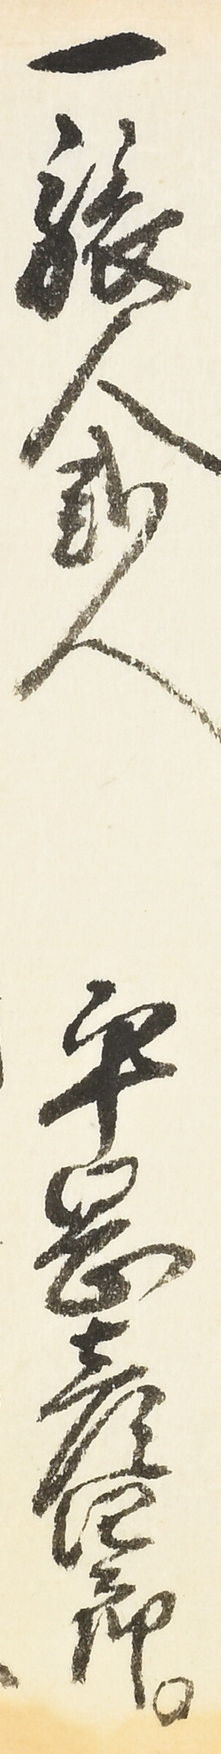一旅人弐人平岡彦四郎。
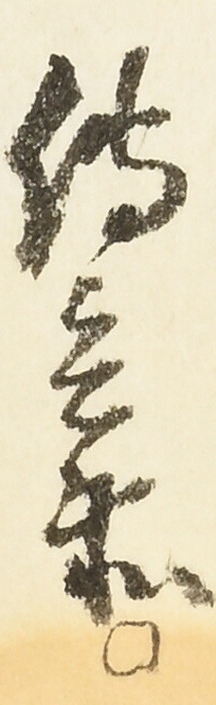治兵衛
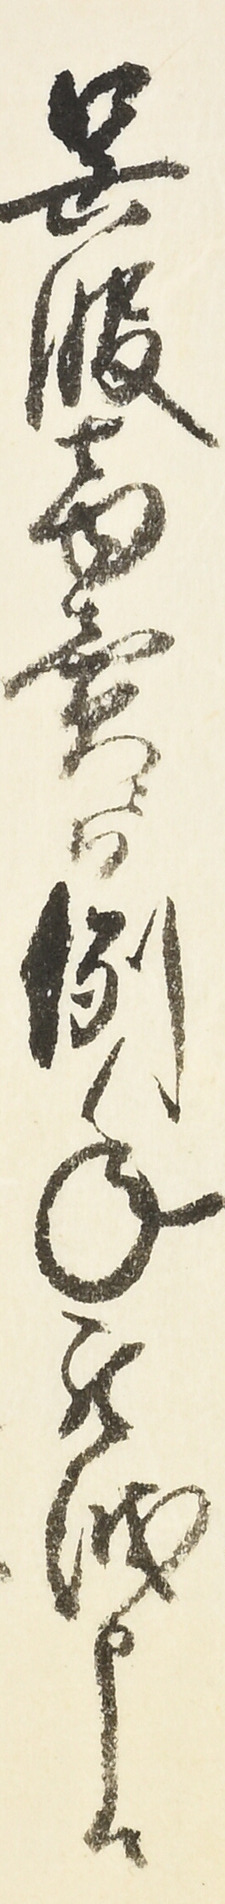呉服商売ニ而例年罷越申候
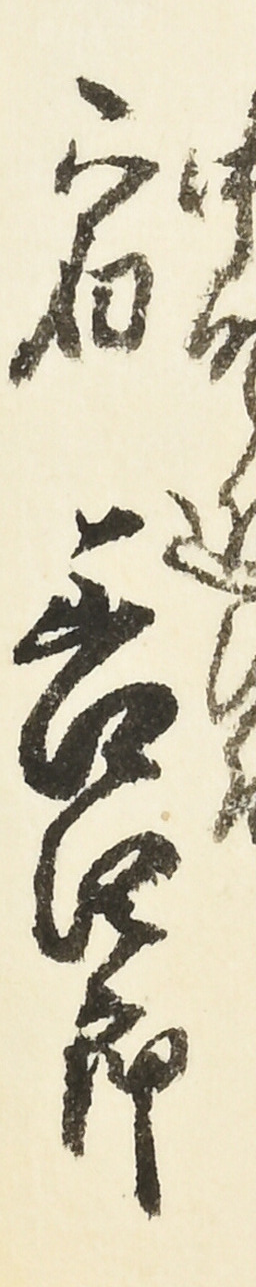宿善四郎
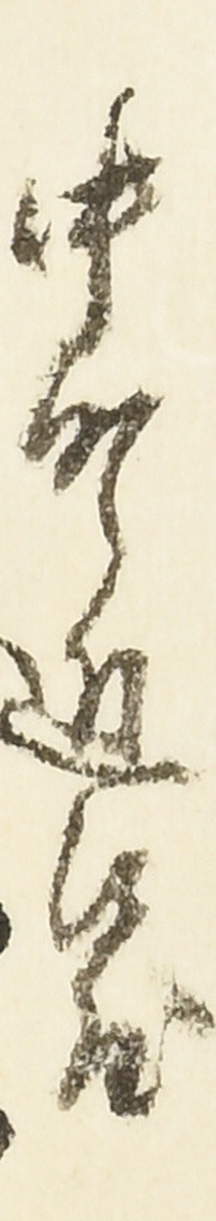中町近江屋
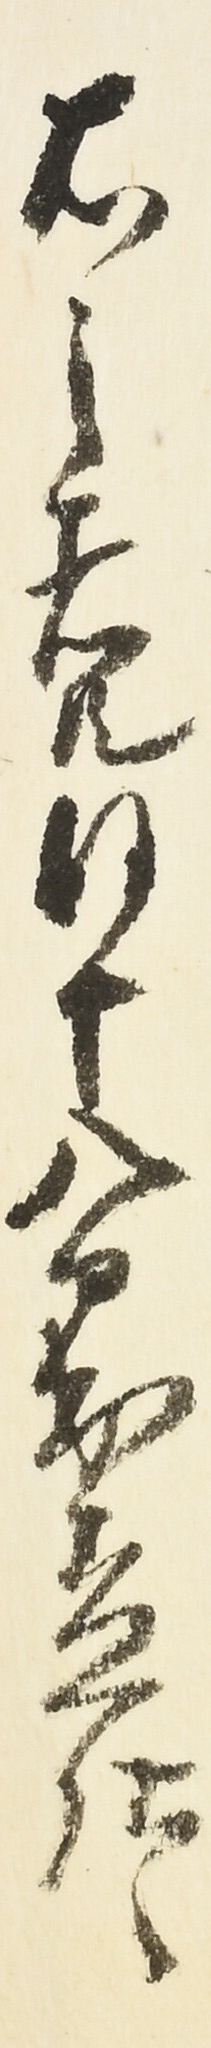右之者共同十八日出立仕候

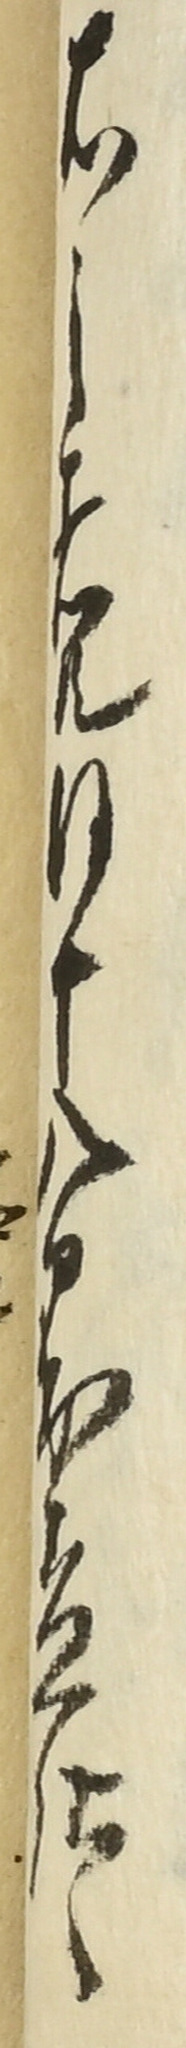右之者同十日出立仕候
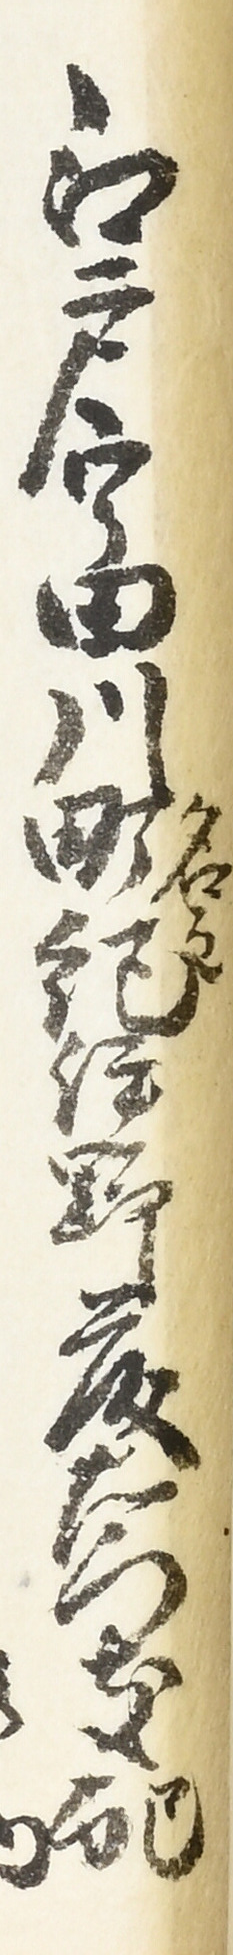江戸歌川町紀伊野藤右衛門支配
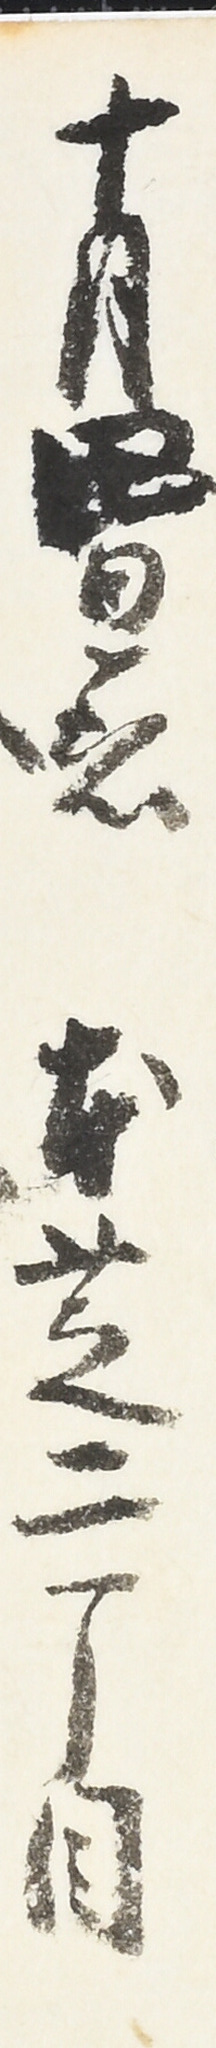十月四日着本芝二丁目
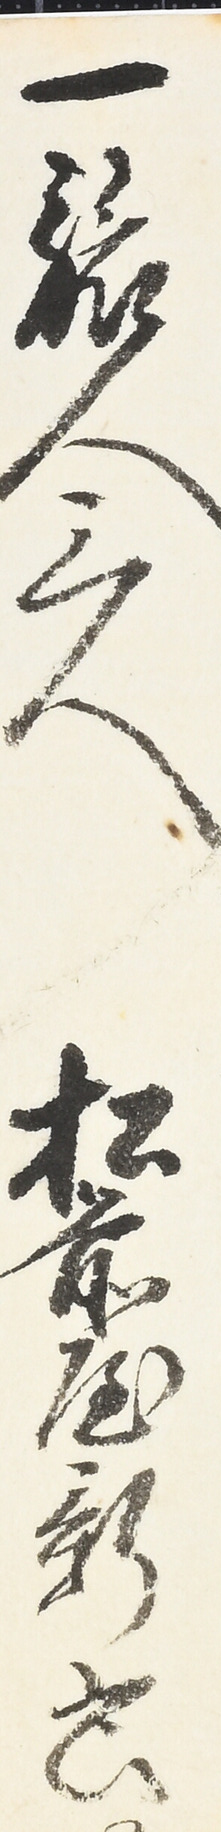一旅人三人松前屋新六。
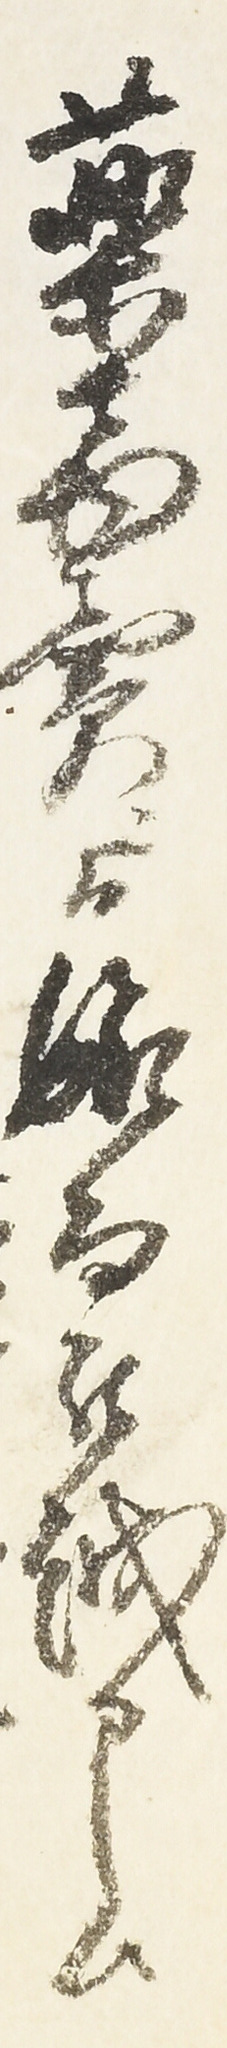薬商売ニ而始而罷越申候
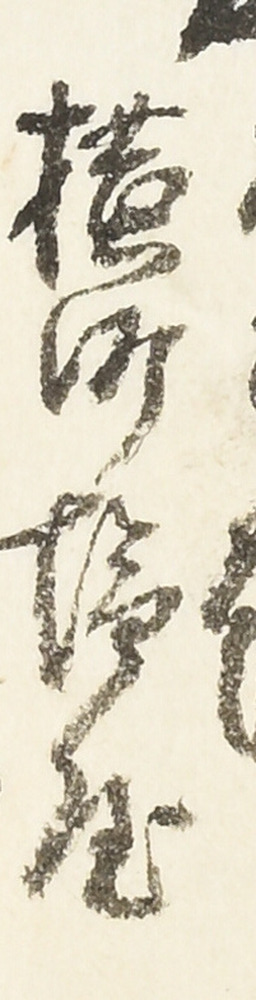横町塩屋
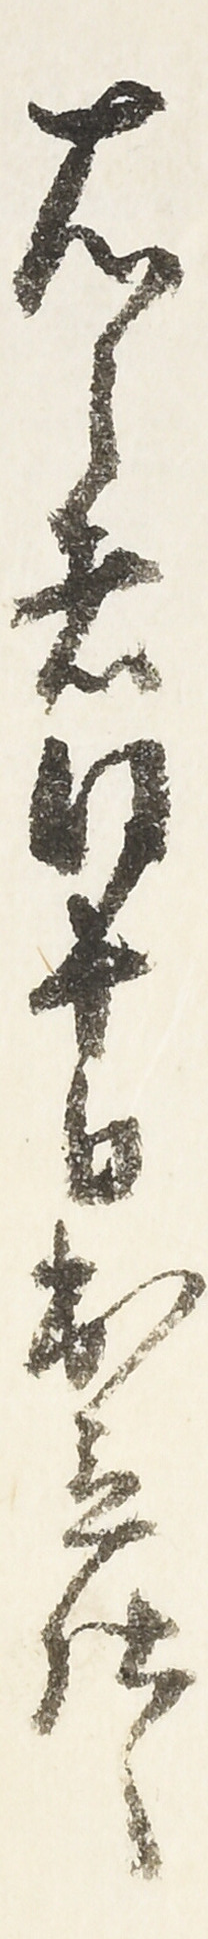右之者同十日出立仕候
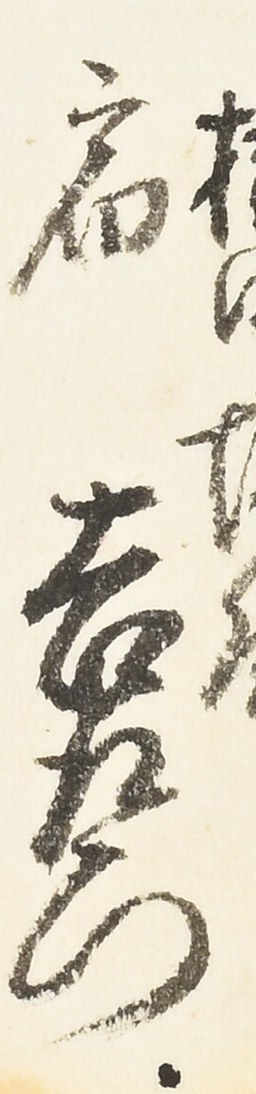宿吉左衛門
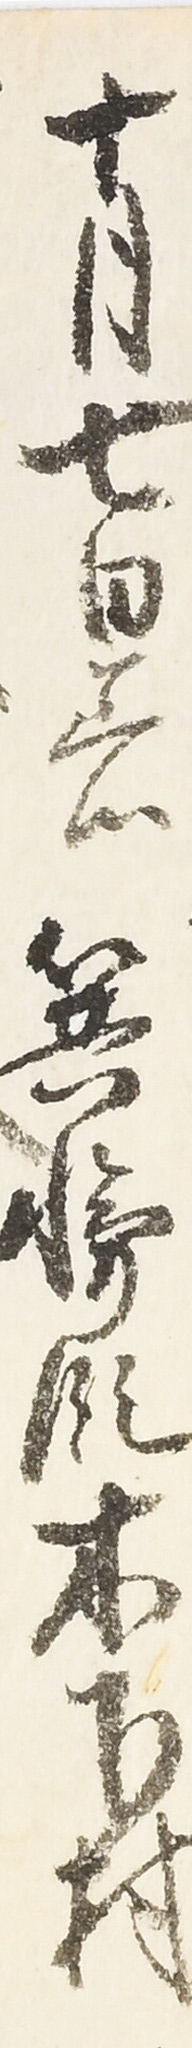十月七日着箕輪領木下町
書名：町中旅人泊控帳
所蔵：伊那市立高遠町図書館・合同会社AMANE
